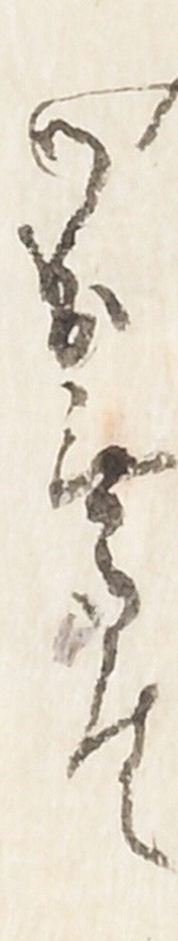御出無御座候
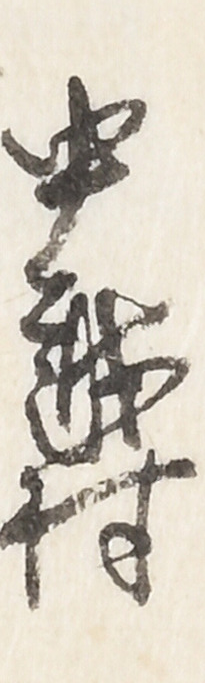中越村
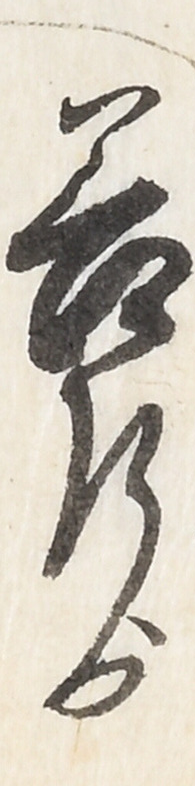善左衛門
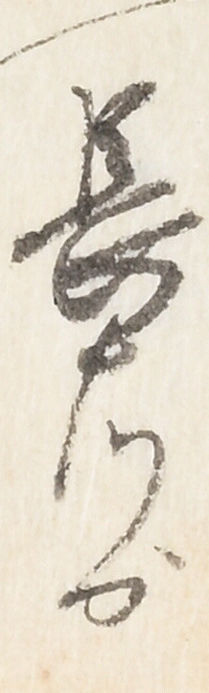仲右衛門

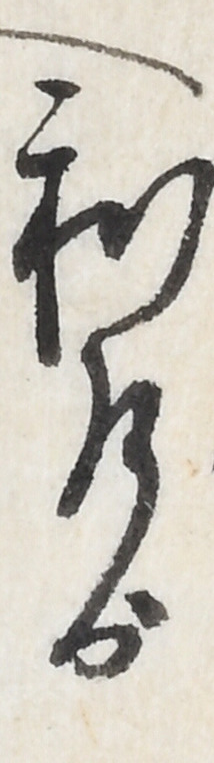治左衛門
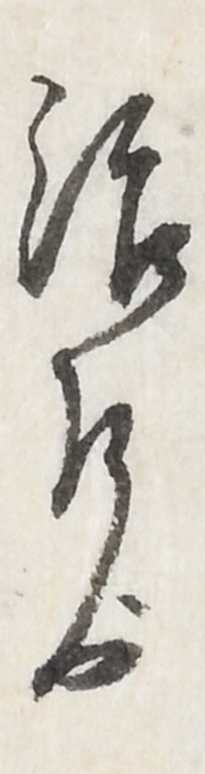治左衛門
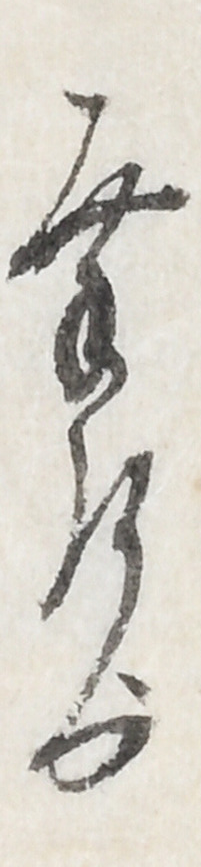幸左衛門
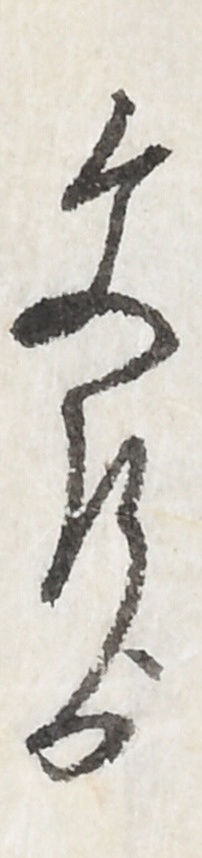治左衛門
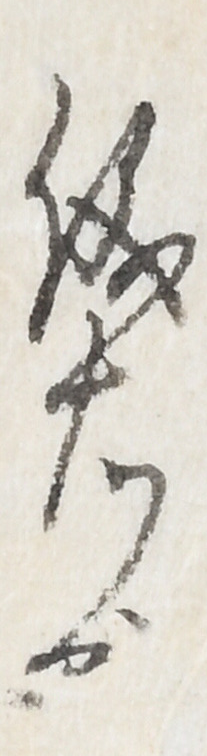儀右衛門
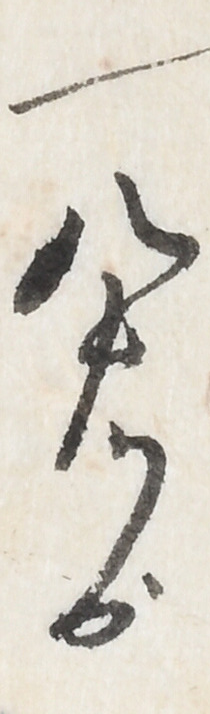八右衛門
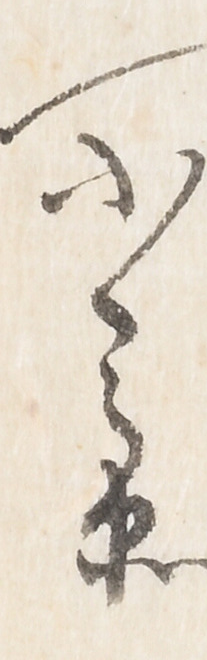小兵衛
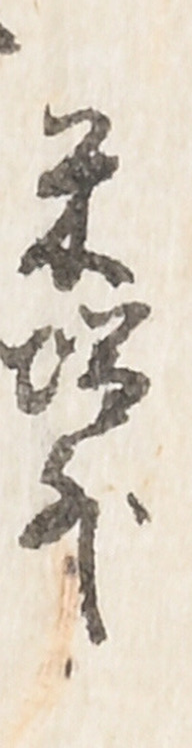米場外
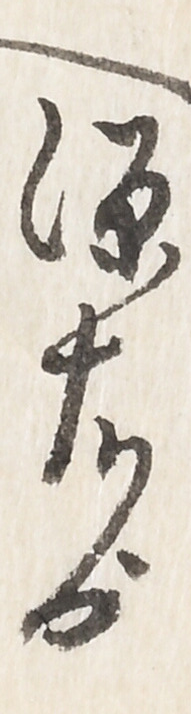源右衛門
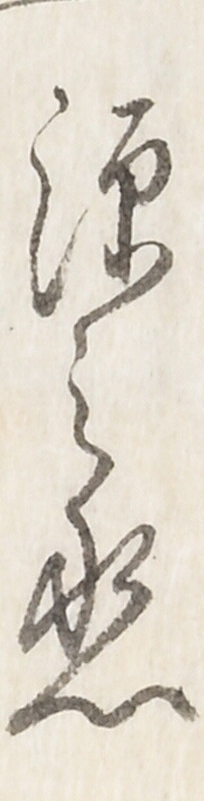源之丞
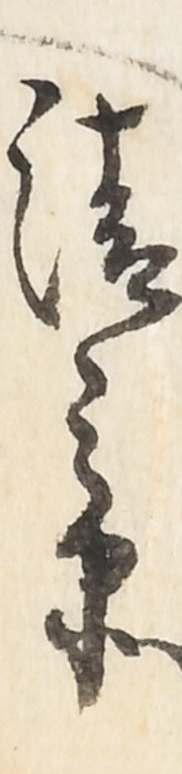清兵衛
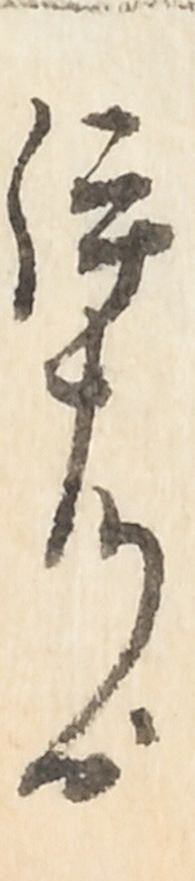伊右衛門
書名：合力覚帳
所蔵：伊那市立高遠町図書館・合同会社AMANE
